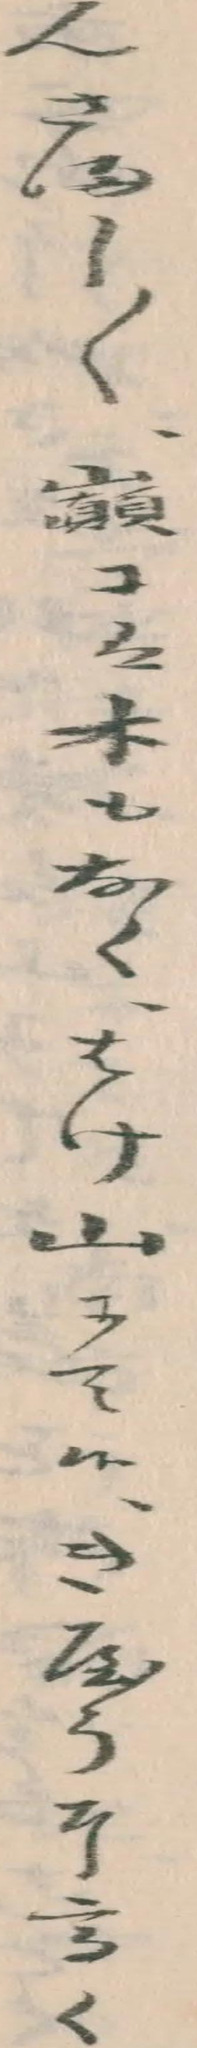んさまし〳〵、巓には木もなく、はけ山にて候、きやうに高く
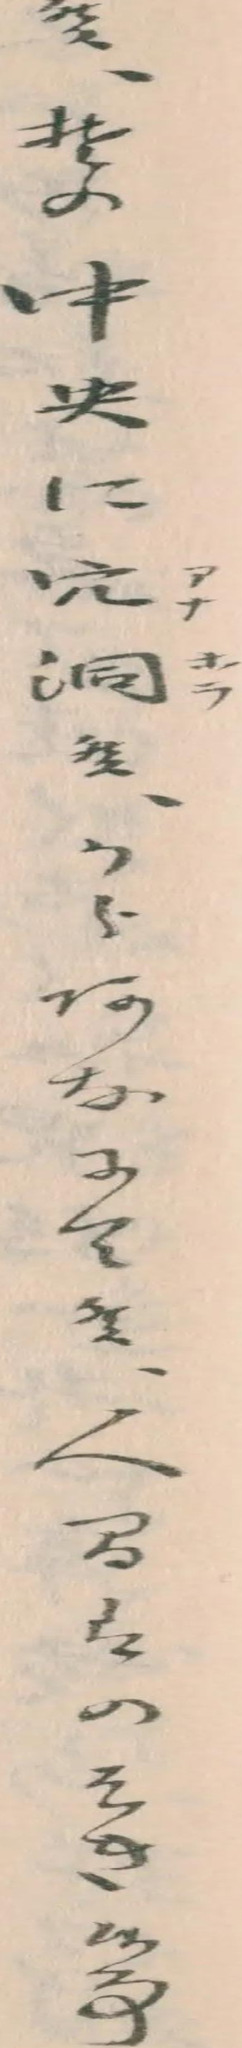候、その中央に穴洞候、からあなにて候、人間はのそき候事
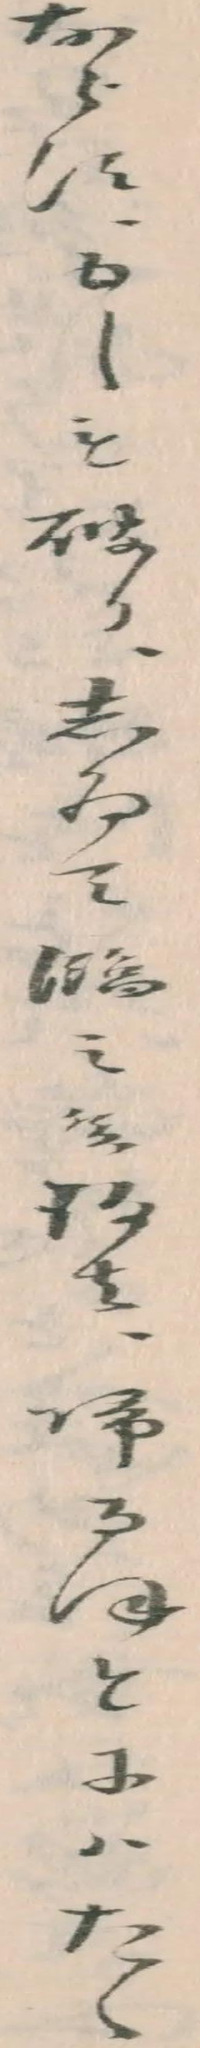ならす、もしも破り、しゐて臨之候得は、帰るほとにはたゝ
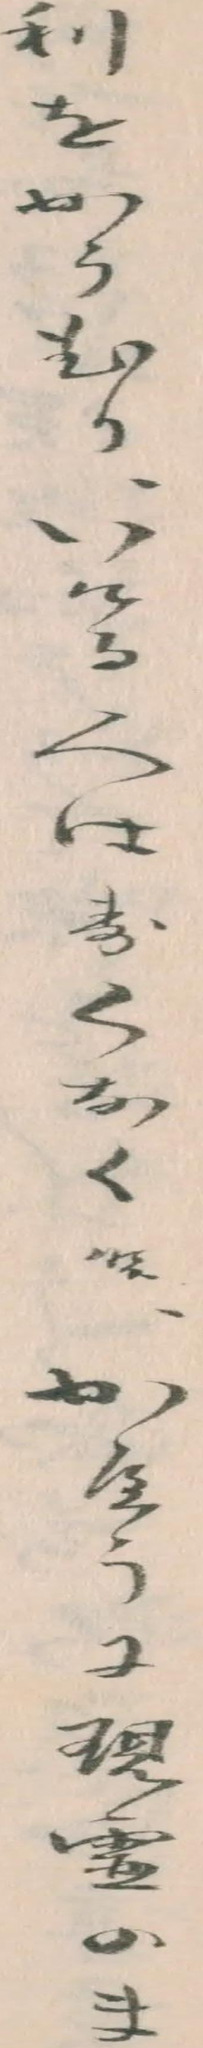りをかうむり、いける人はすくなく候、かやうに現霊のま
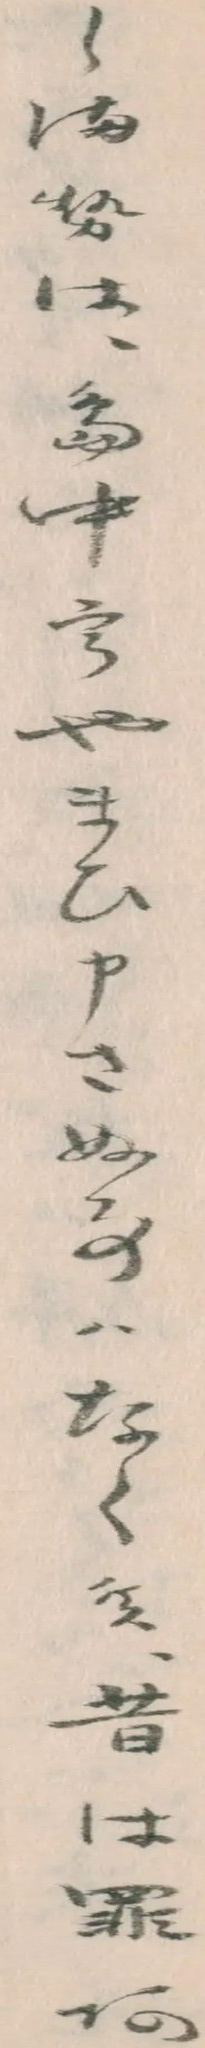しませは、島中うやまひ申さぬ事はなく候、昔は罪あ
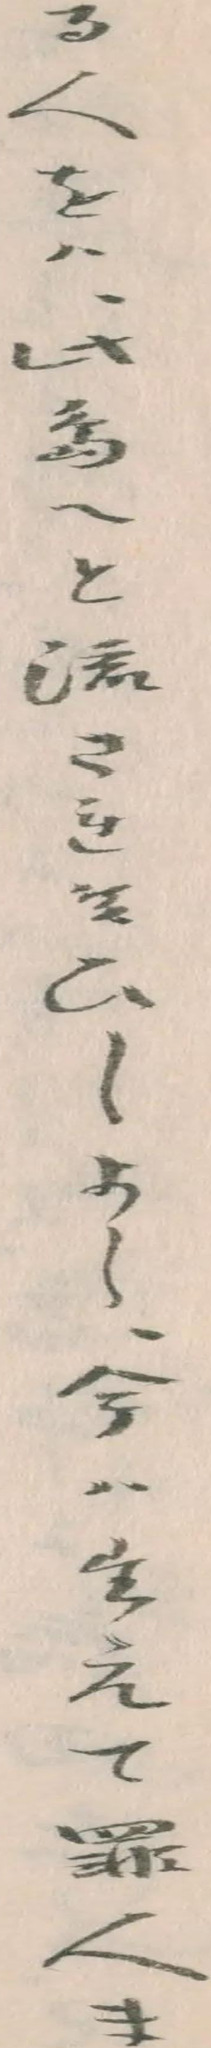る人をは、此島へと流され候ひしよし、今はたえて罪人ま
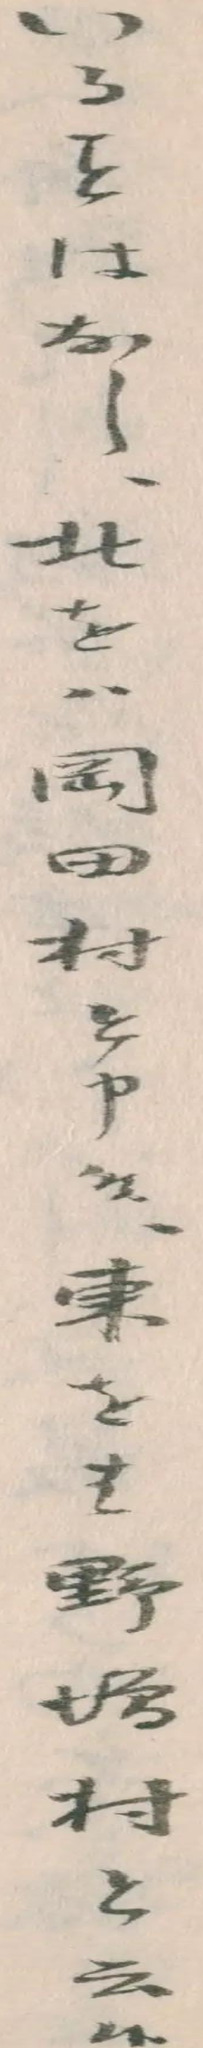いることはなし、北をは岡田村と申候、東をは野増村と云候
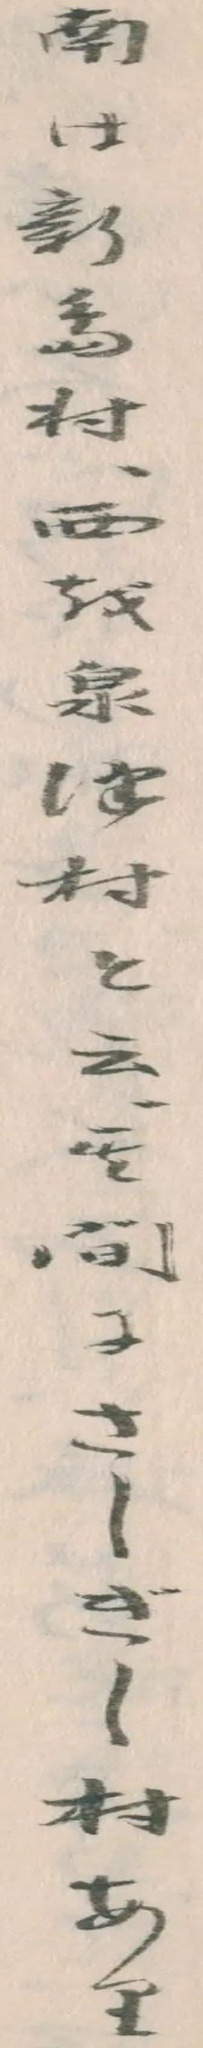南は新島村、西を泉津村と云、其間にさしぎし村あり
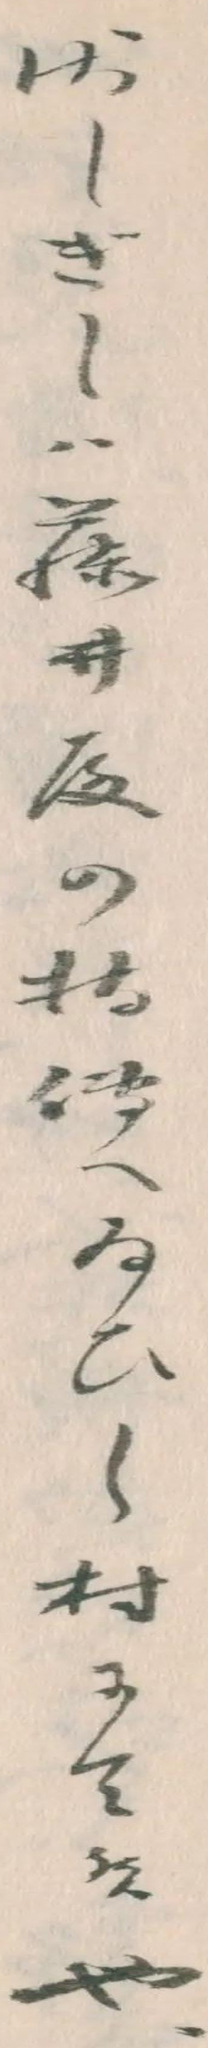さしぎしは藤井殿の持伝へ給ひし村にて候や、
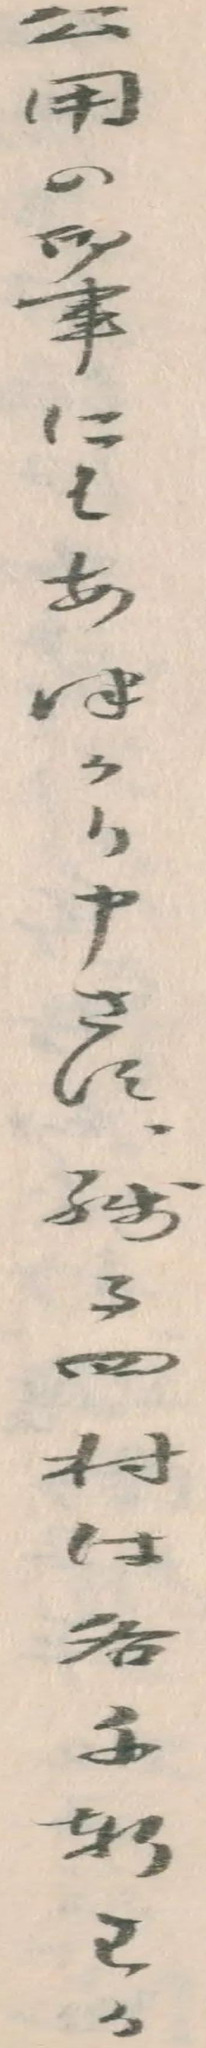公用の御事にはあつかり申さす、残る四村は各に軒はか
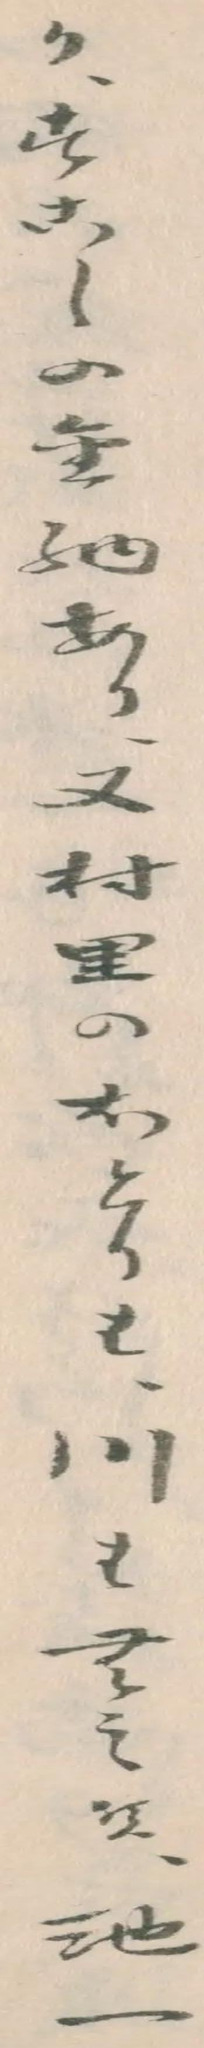り、すこしの金納あり、又村里のほとりは、川は無之候、池一

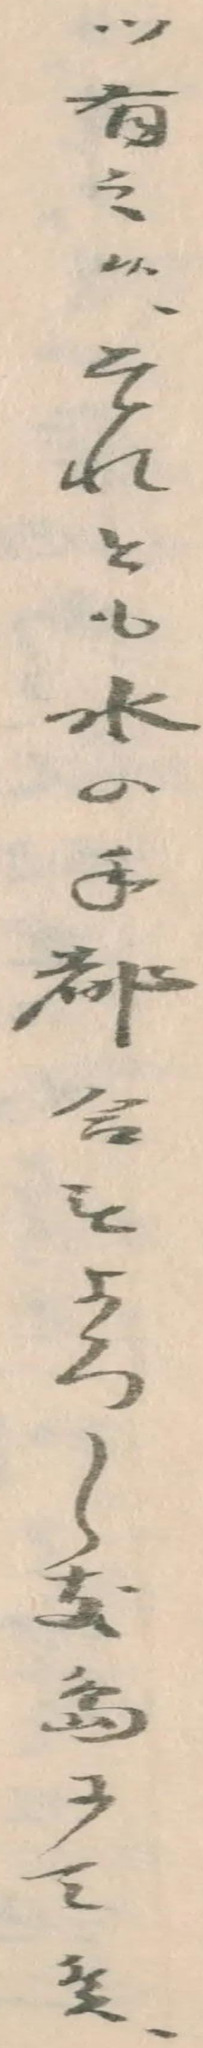ツ有之候、それとも水の手都合もよろしき島にて候、
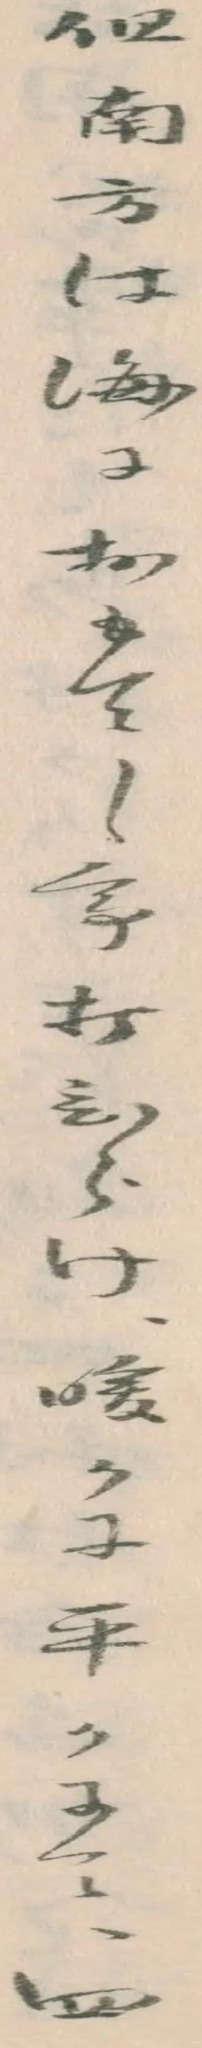但南方は海におもてして打ひらけ、暖かに平かにて、四
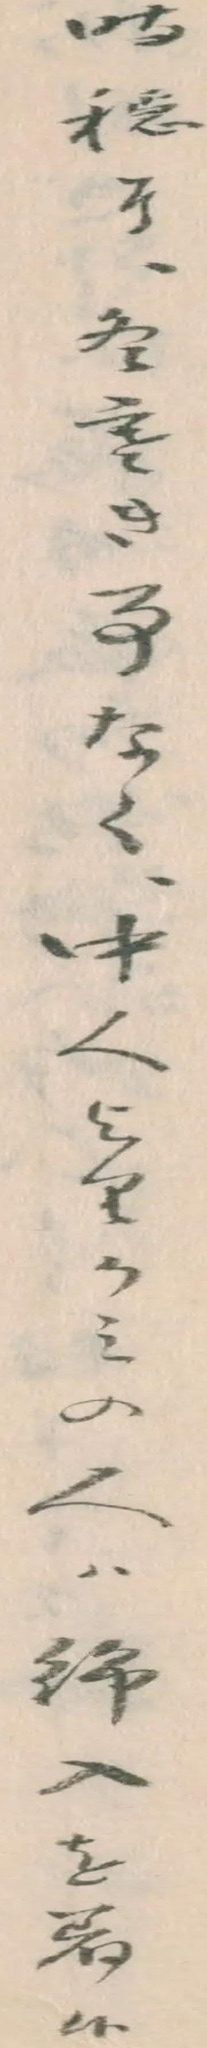時穏に、冬寒き事なく、中人よりかみの人は綿入を着候
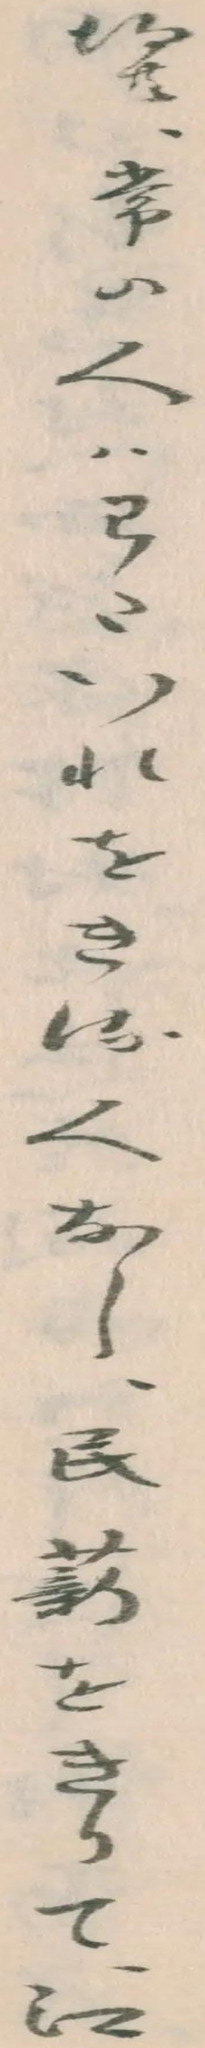得共、常の人はわたいれをきる人なし、民薪をきりて、江
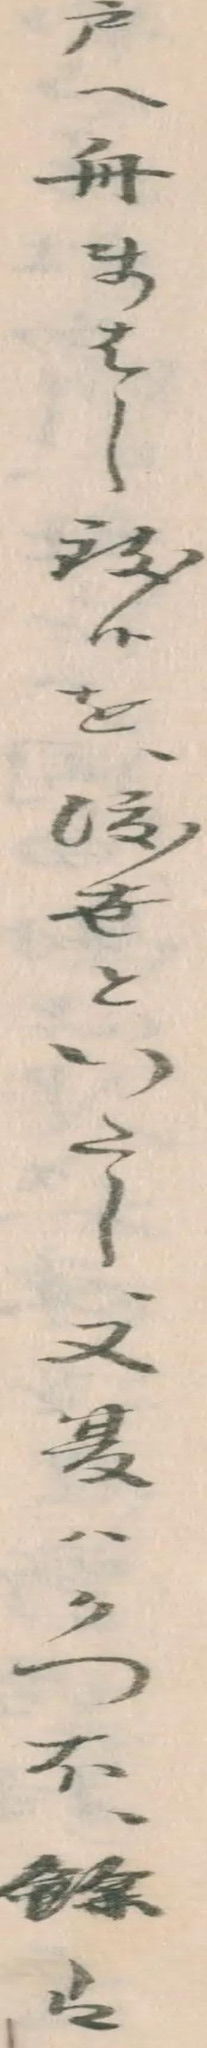戸へ舟まはし致候を、渡世といたし、又夏はかつほ、余は
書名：地災撮要. 巻11-12(地震之部)
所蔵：国立国会図書館 National Diet Library, JAPAN
